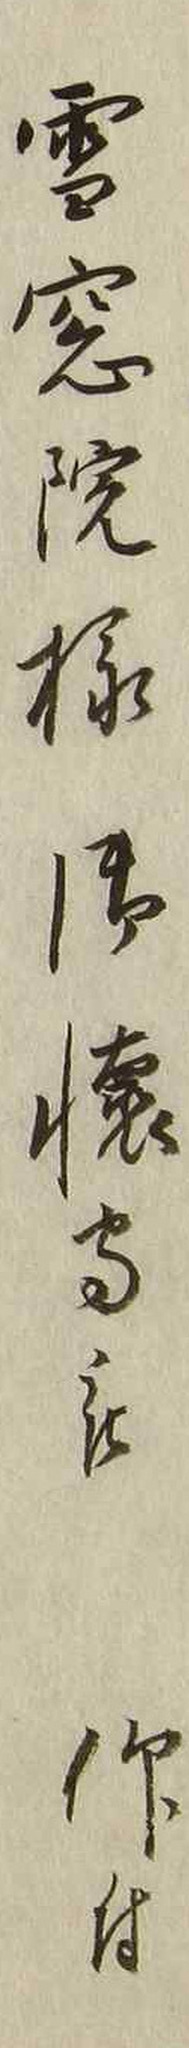雪窓院様御懐守被仰付
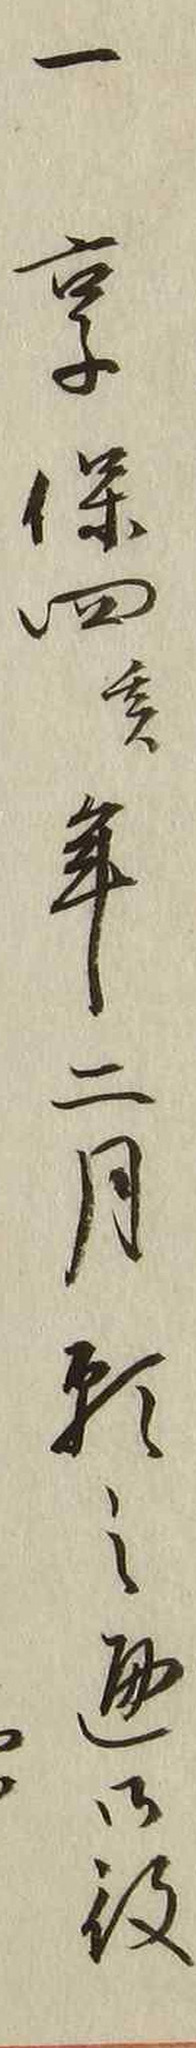一享保四亥年二月願之通御役
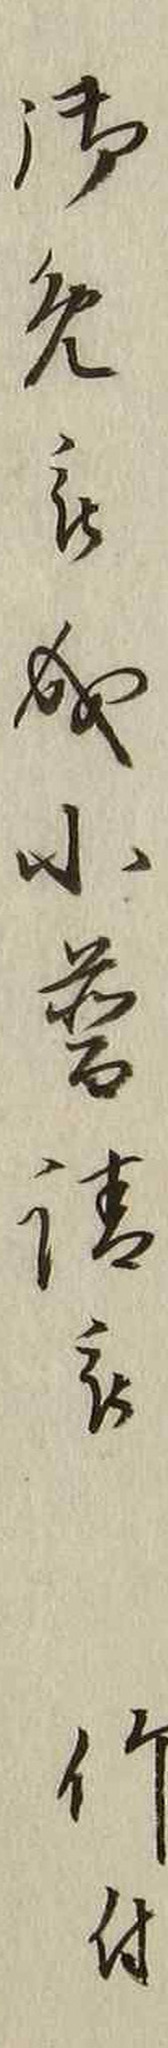御免被成小普請被仰付
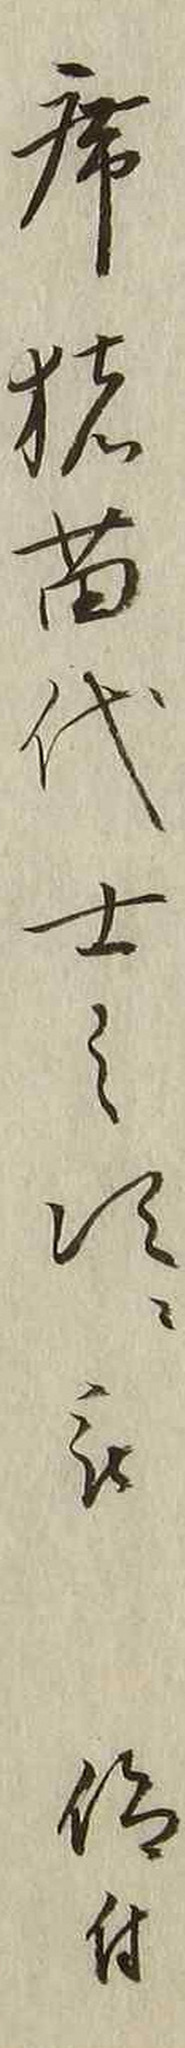席猪苗代士之次ニ被仰付
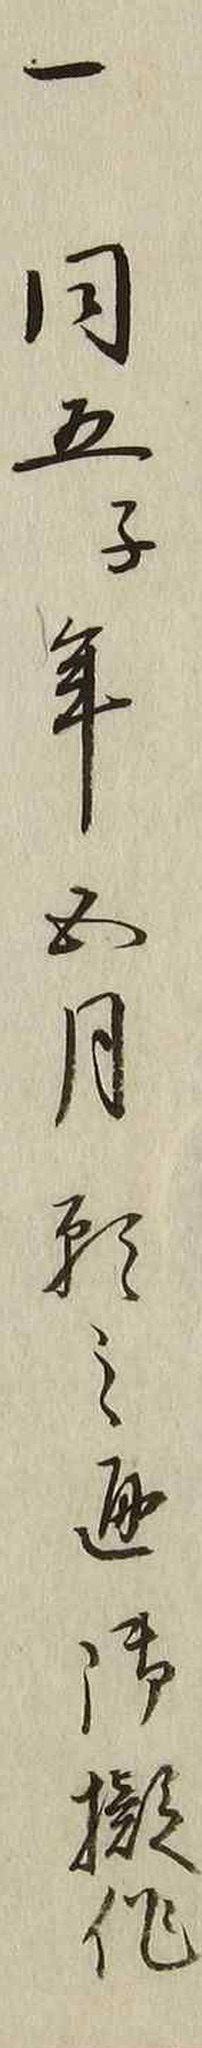一同五子年五月願之通御擬作
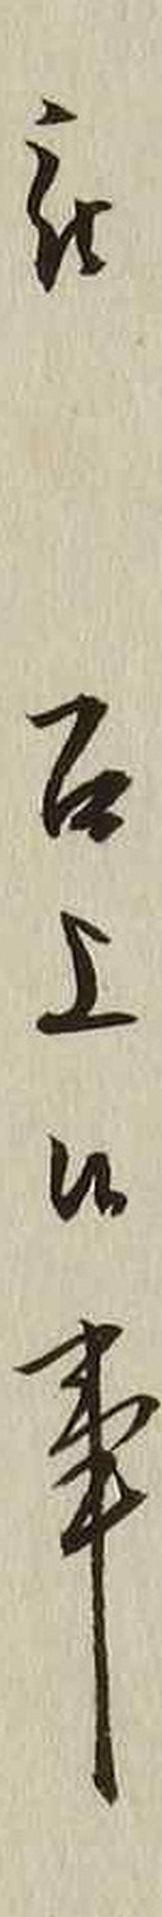被召上候事
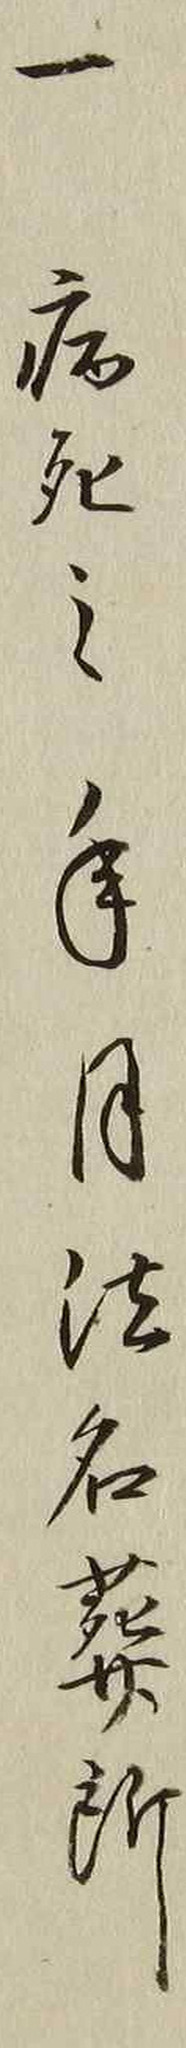一病死之年月法名葬所
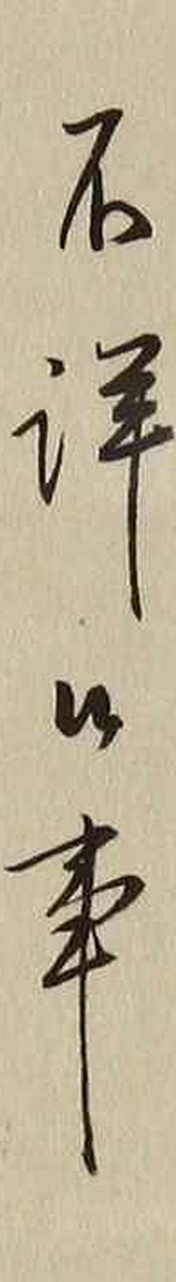不詳候事
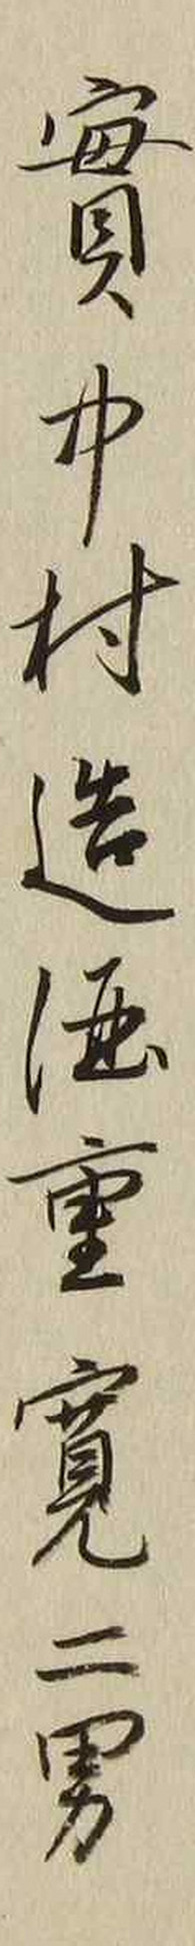実中村造酒重寛二男
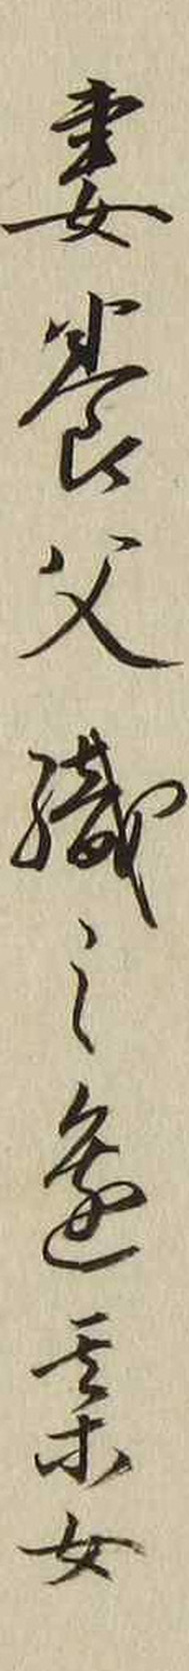妻養父織之進某女
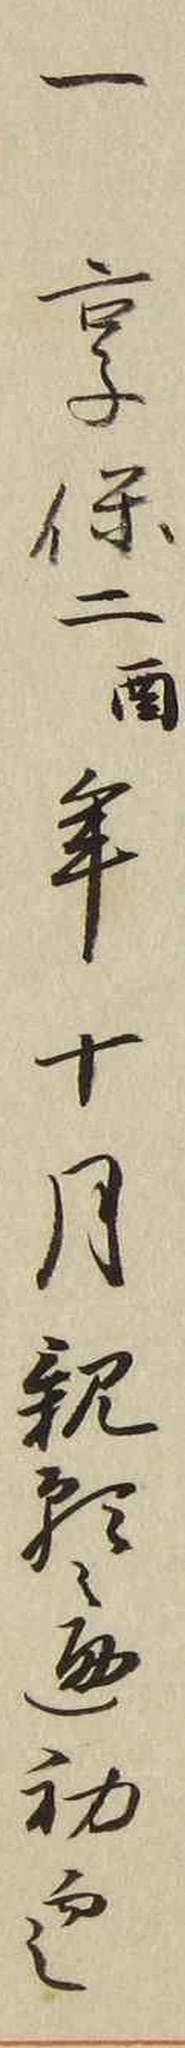一享保二酉年十月親願之通初而之

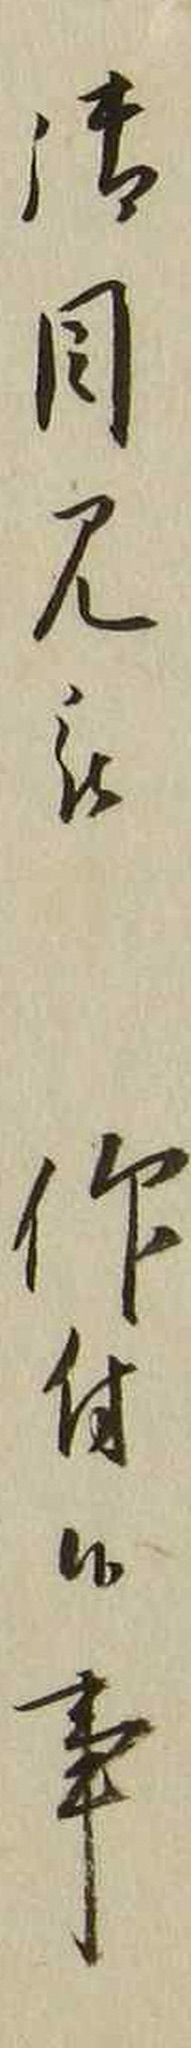御目見被仰付候事
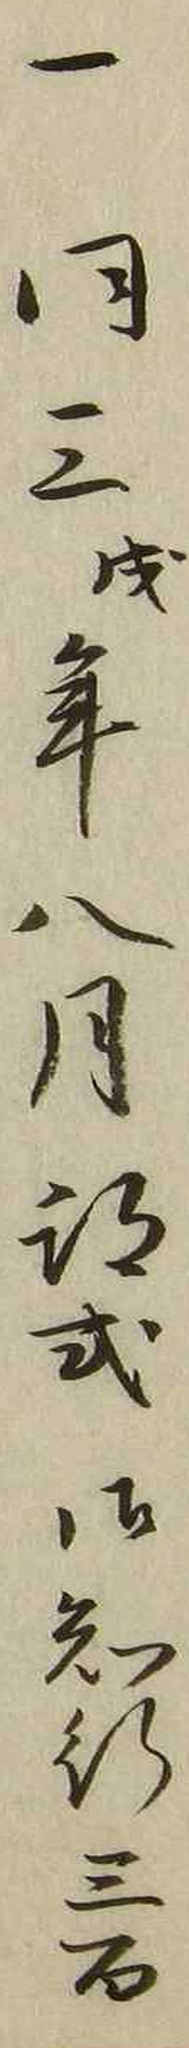一同三戌年八月跡式御知行三百
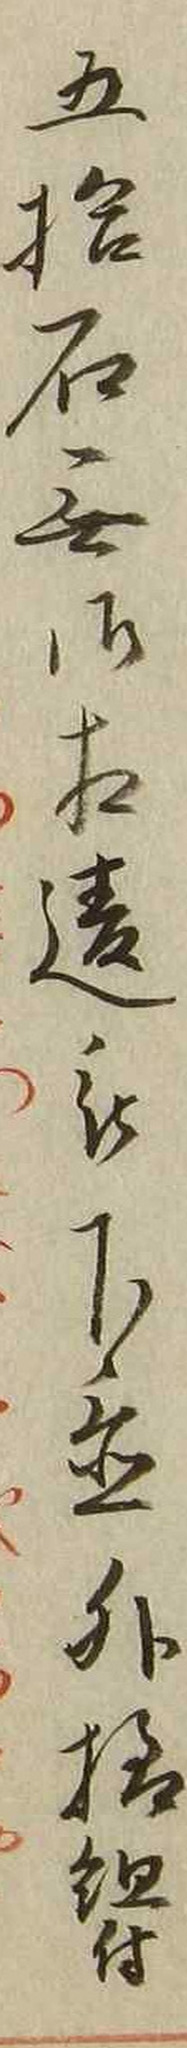五拾石無御相違被下置外様組付
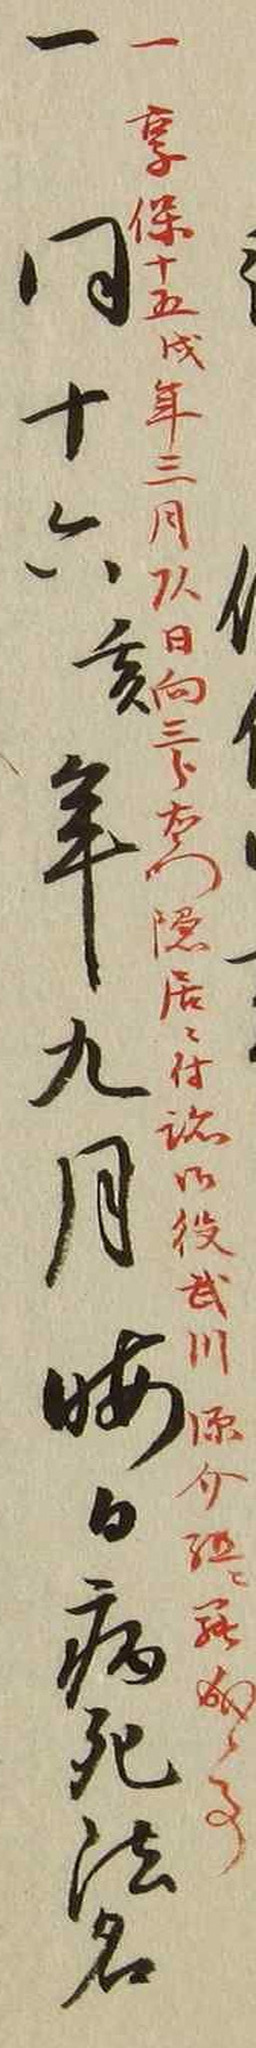一同十六亥年九月晦日病死法名
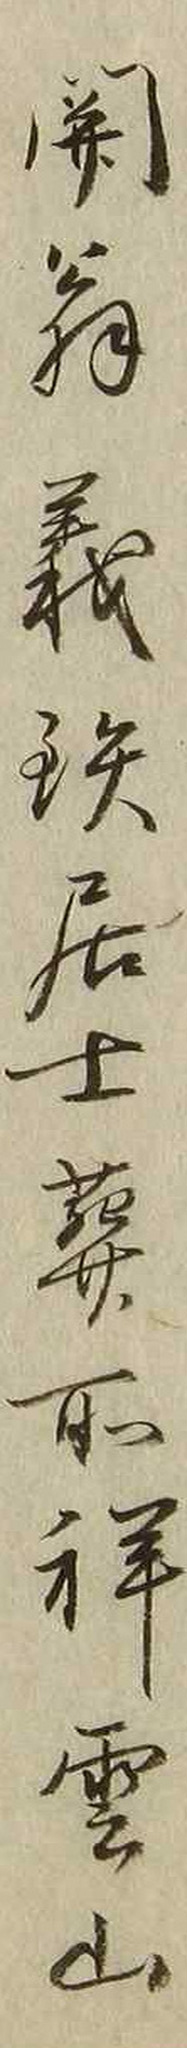開翁義鉄居士葬所祥雲山
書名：諸士系譜　巻之22　い之部22
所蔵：会津若松市立会津図書館
